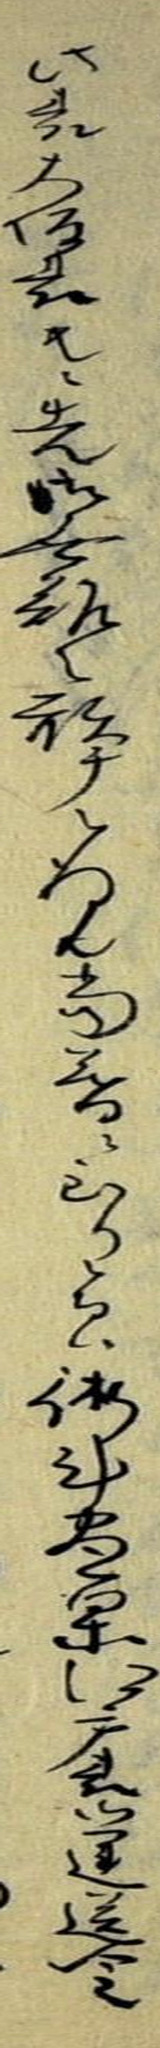此表大坂表共に先御無難之形ち候得共当暮に至り候而は術計尽果江戸表御運送金
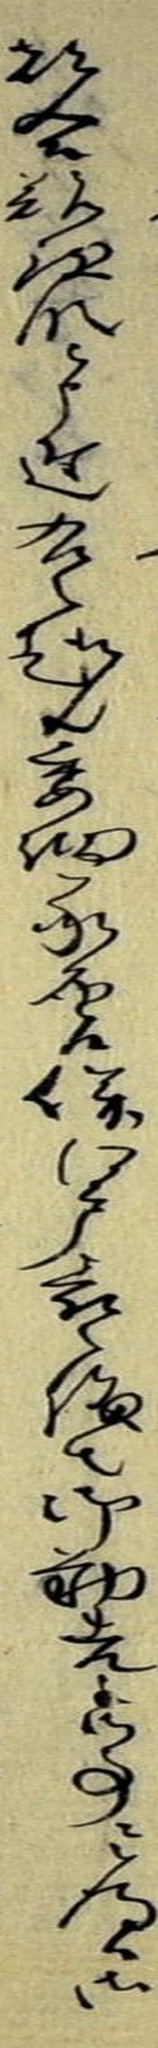都合難致段被申達右之趣共委細承届候併江戸表之儀は御勤先之御事に候得は御
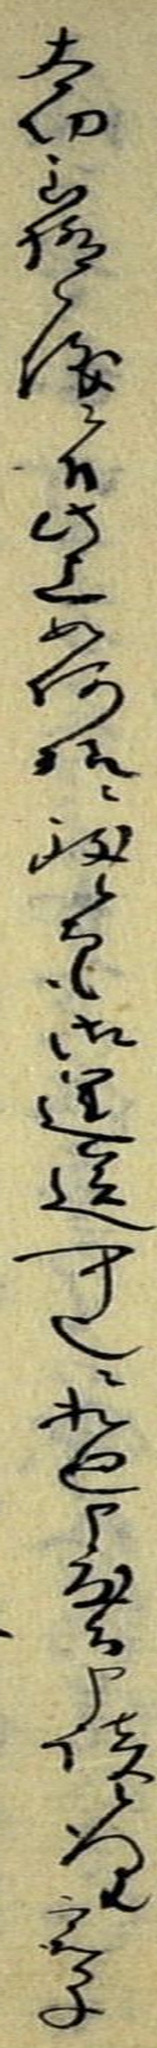太切至極之儀に付此上如何様に致候而も御運送可也に相廻申度旨申談候得共最早
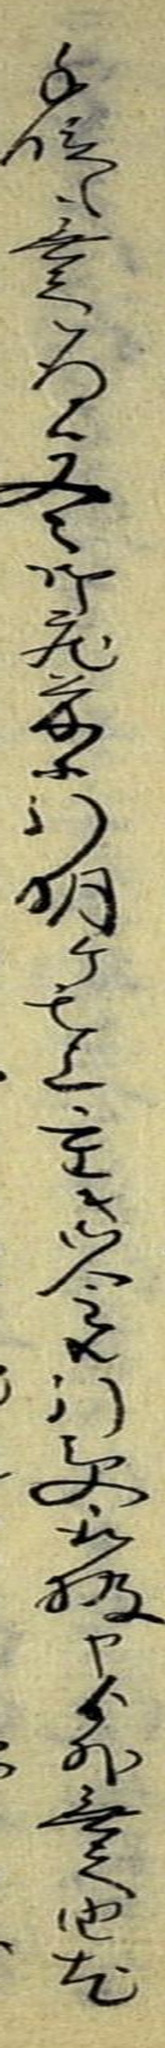手段も無之候得は又々御蔵米等引明ケ其上重き御金共引受取扱申ゟ外無之由尤
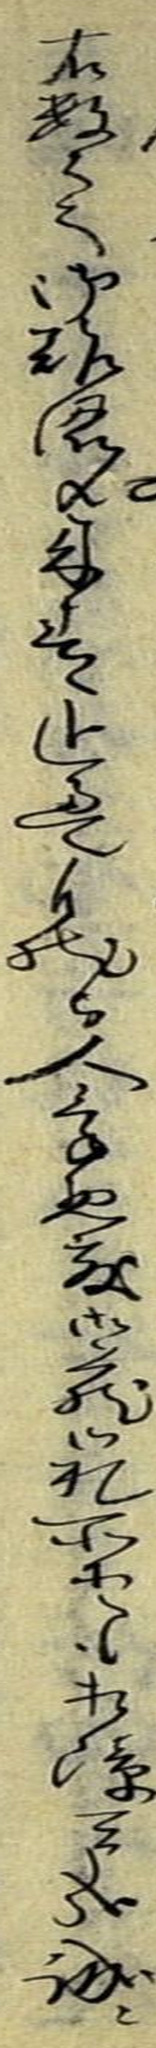右数々之御難渋共来春へ追畳自然与人気悪敷御蔵御札所等へも相障可申哉誠に
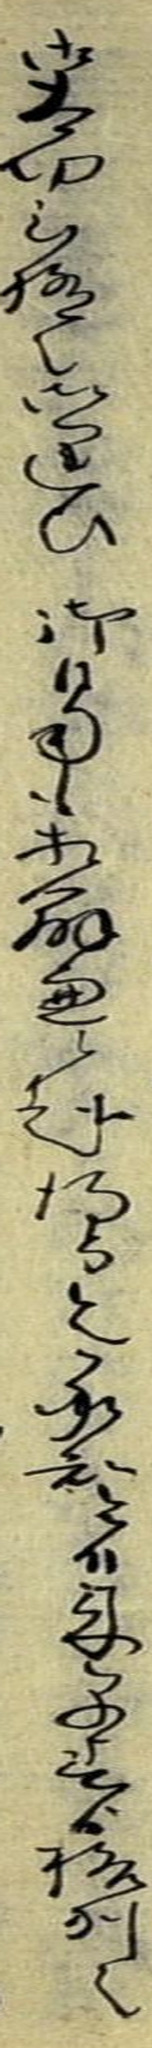御太切至極之御運ひ御日用も相弁兼候趣得与令承知候に付来早春ゟ格別之
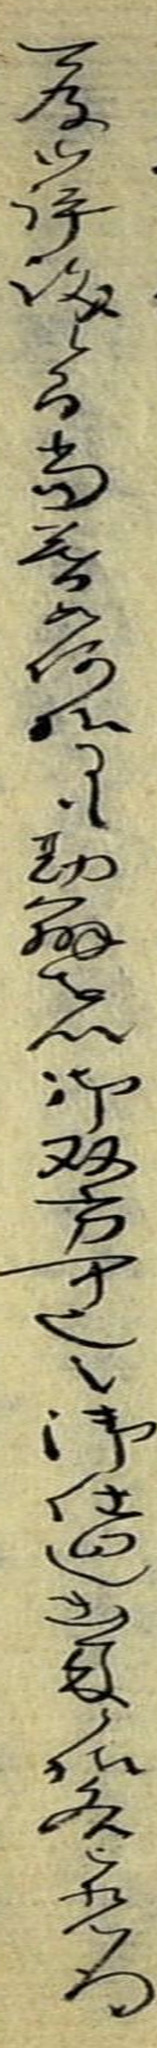可及御評議候間当暮如何様にも勘弁を以御双方可也之御仕廻出来候様各被相心得
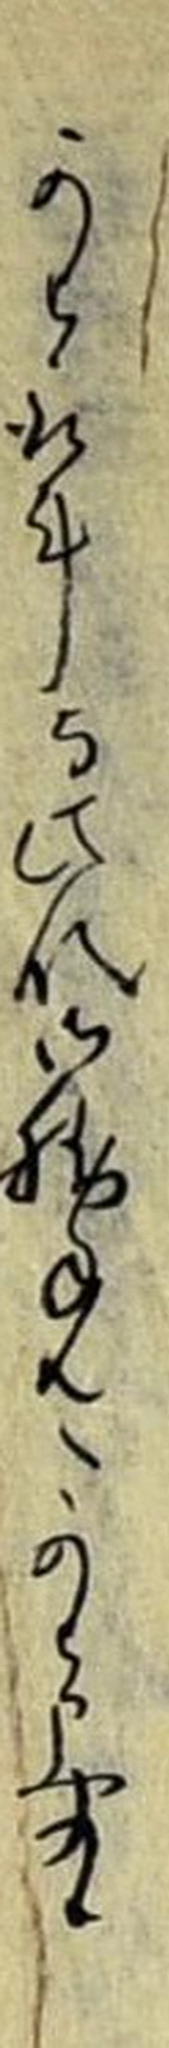可被取斗与此段御勝手共へ可被申聞候
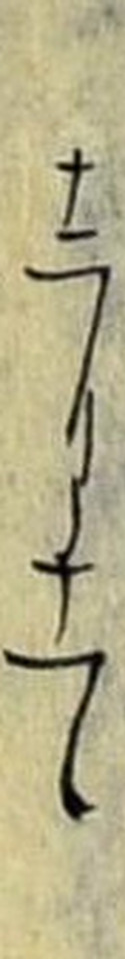十二月十一日

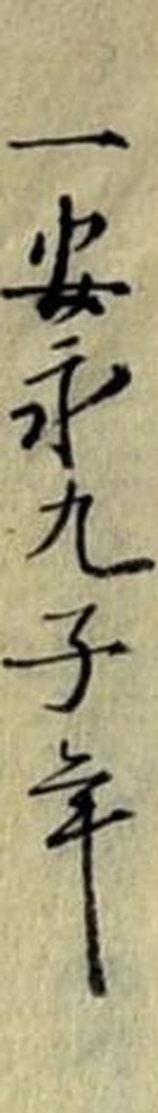一安永九子年
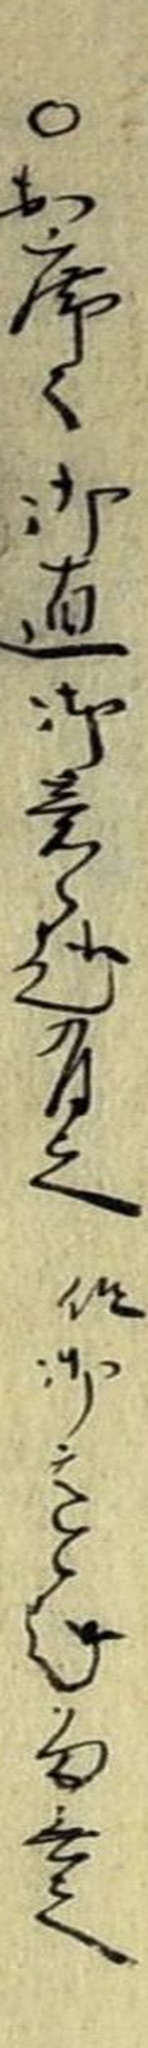〇於席々御直御意之趣有之但御意之趣留無之
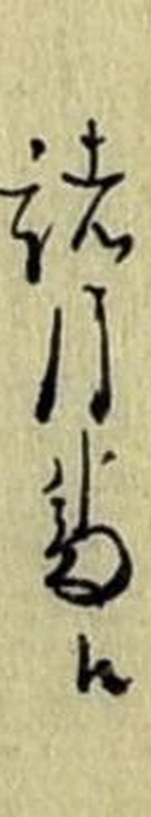諸月番え
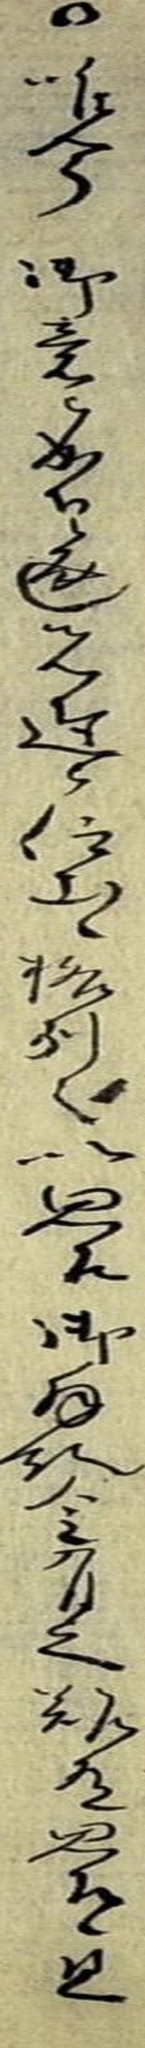〇唯今御意被成下候通先達被仰出候格別之以思召御拝領金有之難有思召候且
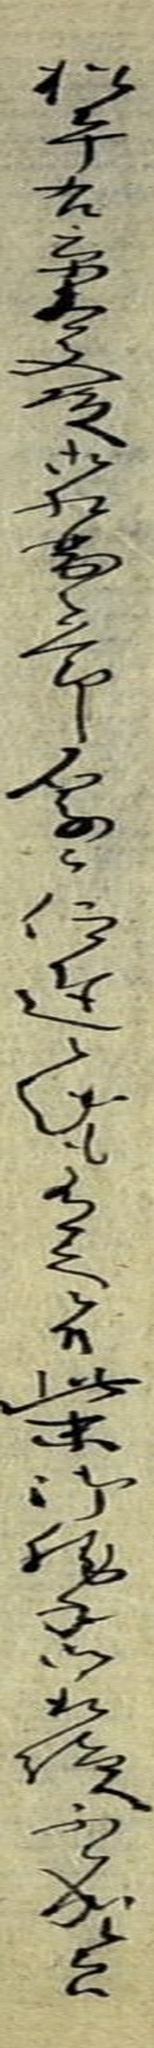松平右京太夫殿御相対之節厚被仰達候趣も有之に付此末御勝手御取続不被成候而は
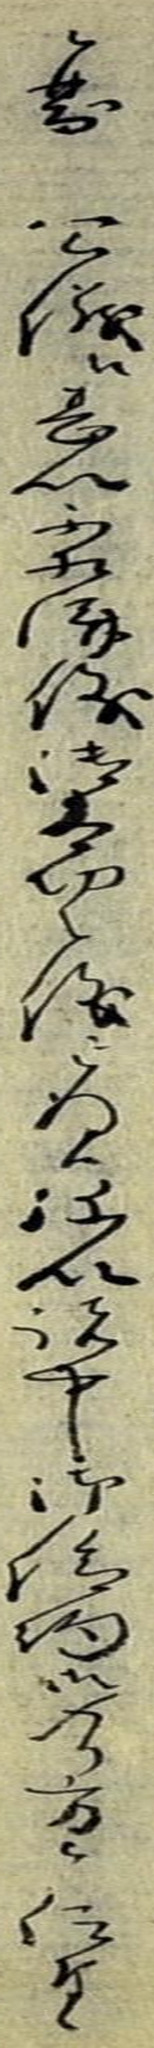被対公儀え甚以不相済儀御太切之儀に候得は弥以諸中御倹約御〆り方被仰付候
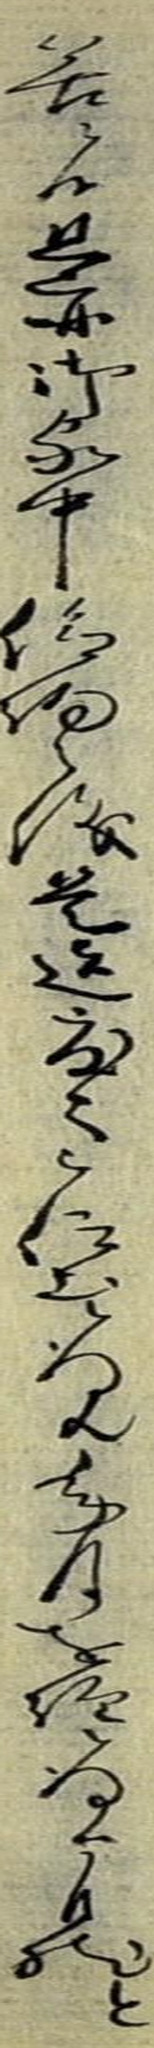筈に候且亦御家中倹約之儀是迄度々被仰出候得共年月を経候得は自然と
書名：命令之部 二
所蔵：福井県文書館 Fukui Prefectural Archives
